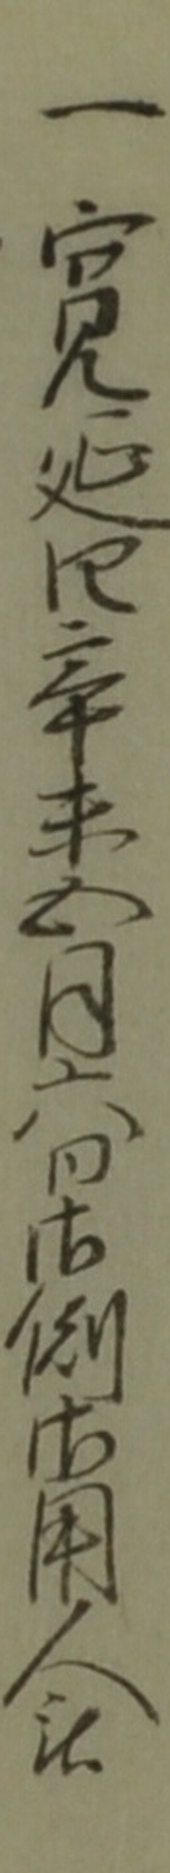一寛延四辛未五月六日御側御用人被
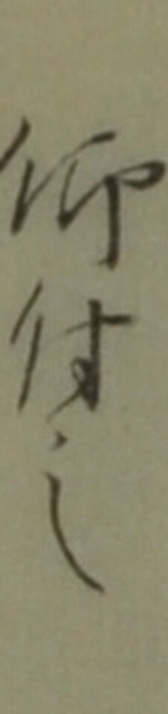仰付之
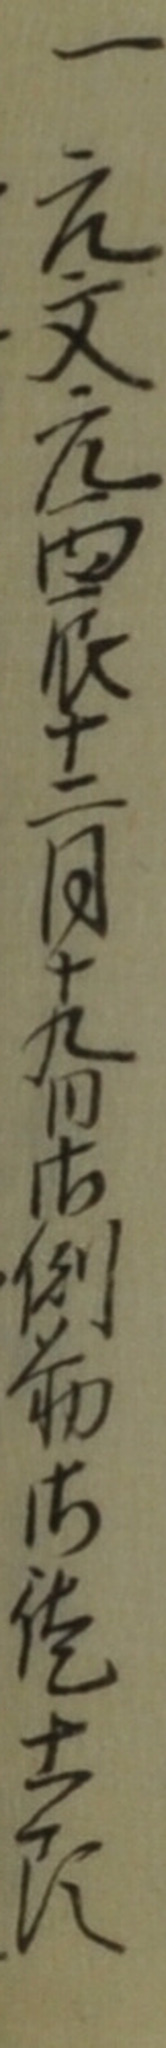一元文元丙辰十二月十九日御側勤御徒士頭
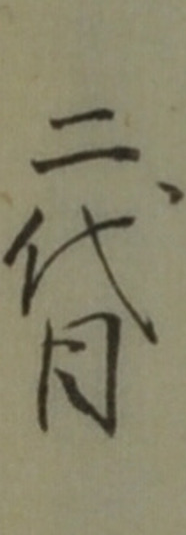二代目
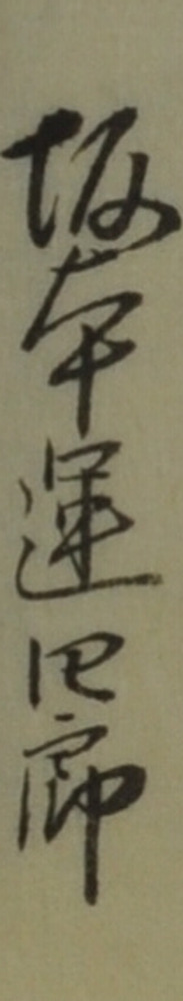坂本運四郎
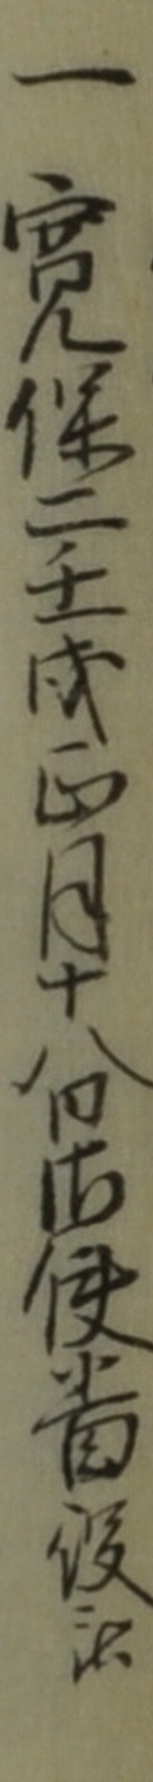一寛保二壬戌正月十八日御使番役被
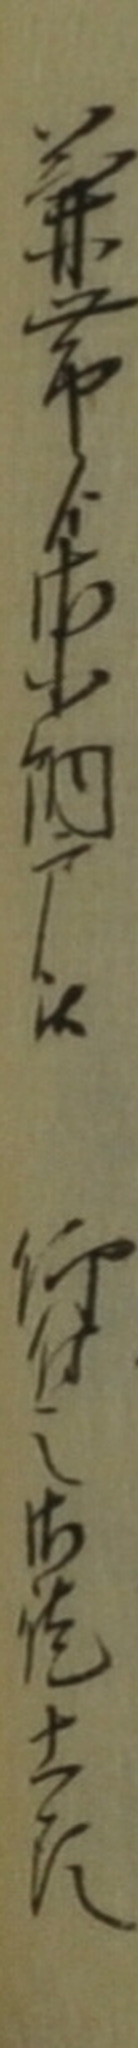兼帯ゟ御小納戸被仰付之御徒士頭
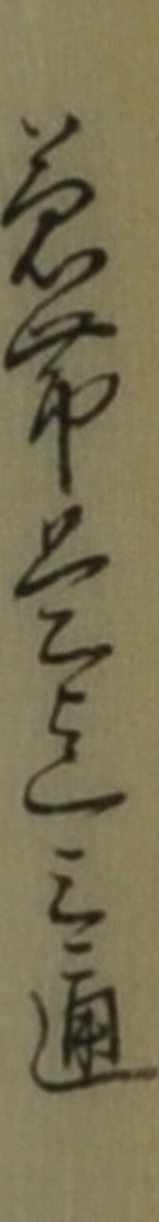兼帯是迄之通
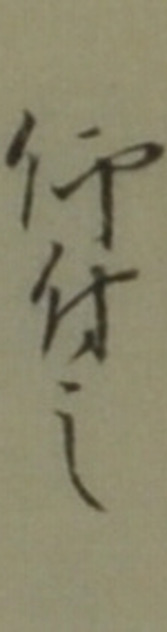仰付之
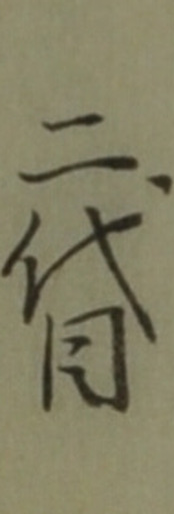二代目
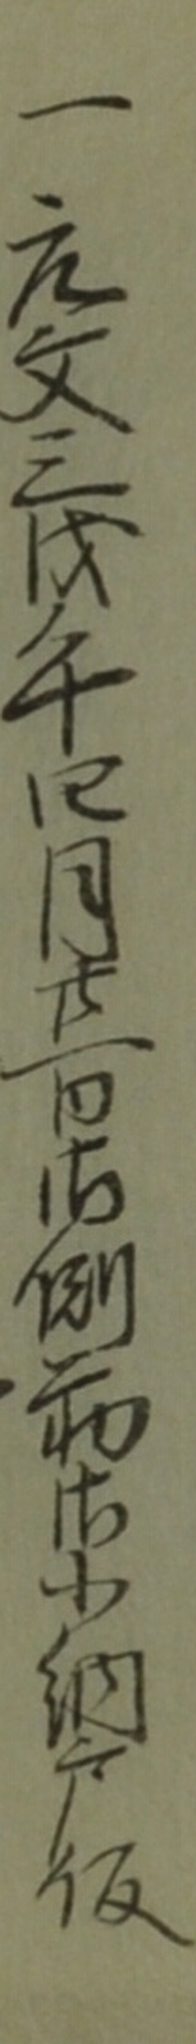一元文三戊午四月廿一日御側勤御小納戸役
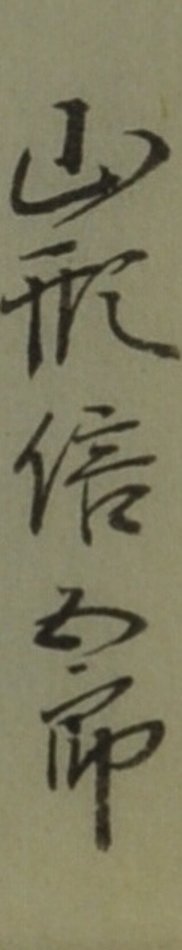山形信五郎
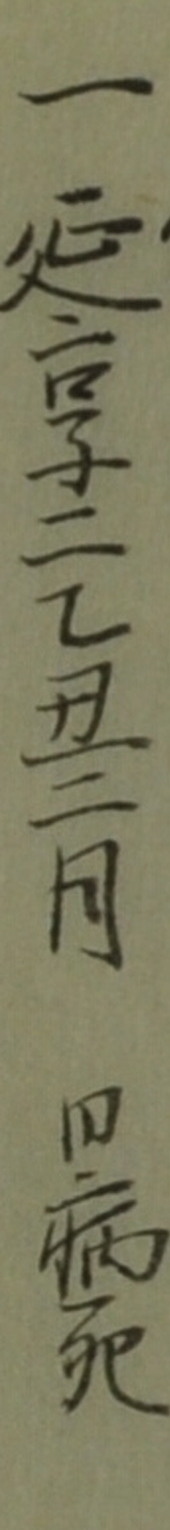一延享二乙丑二月日病死
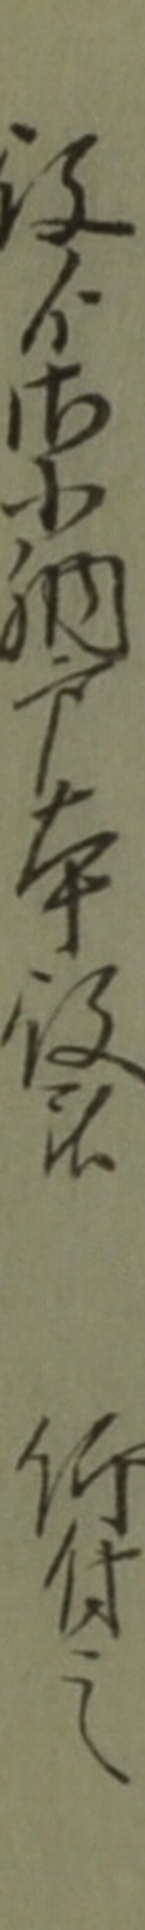役ゟ御小納戸本役被仰付之
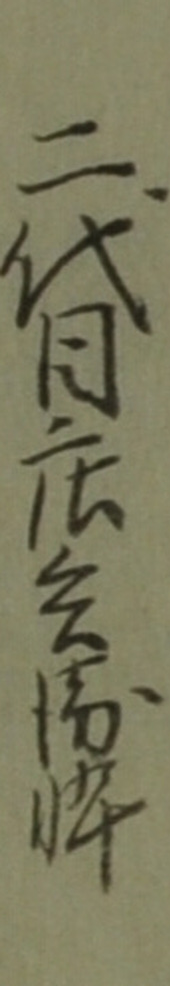二代目庄兵衛忰
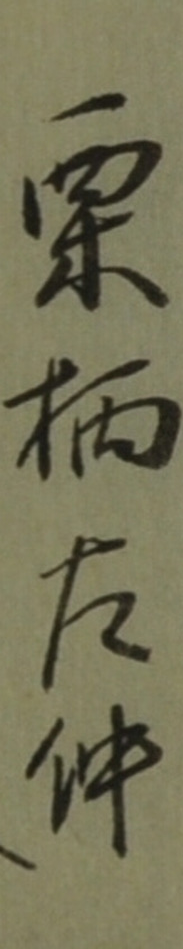栗栖左仲
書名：諸御役代々録（四）
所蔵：伊那市立高遠町図書館・合同会社AMANE
